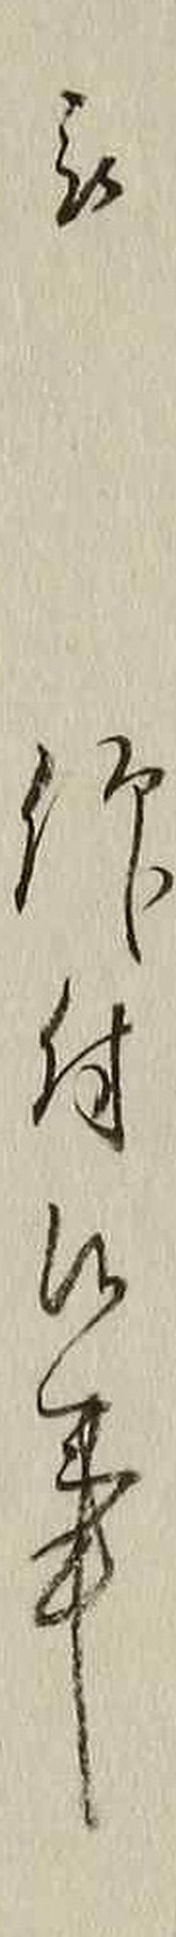被仰付候事
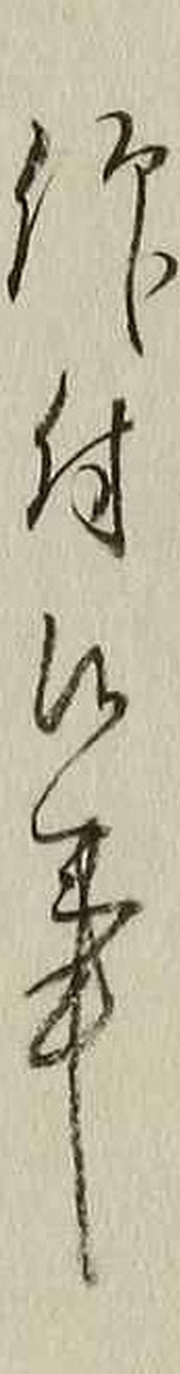仰付候事
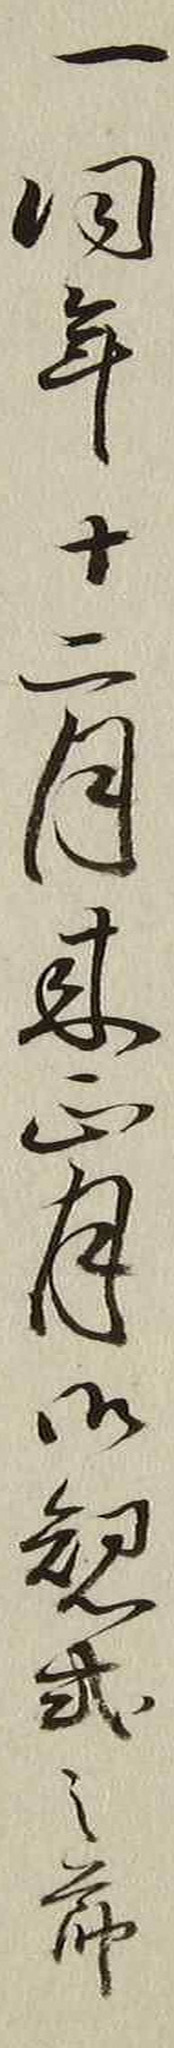一同年十二月来正月御規式之節
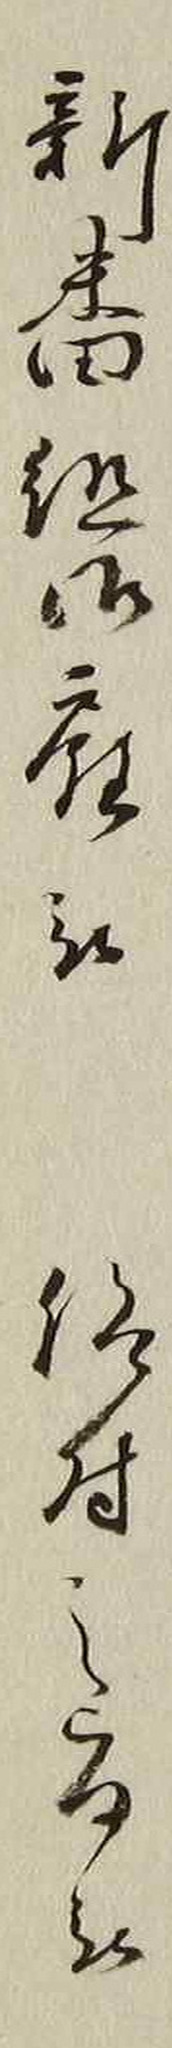新番組御雇被仰付之旨被
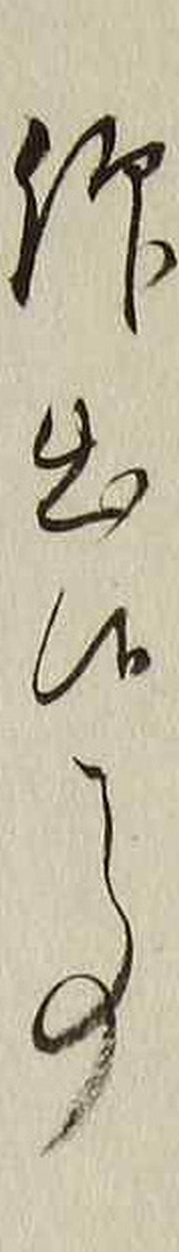仰出候事
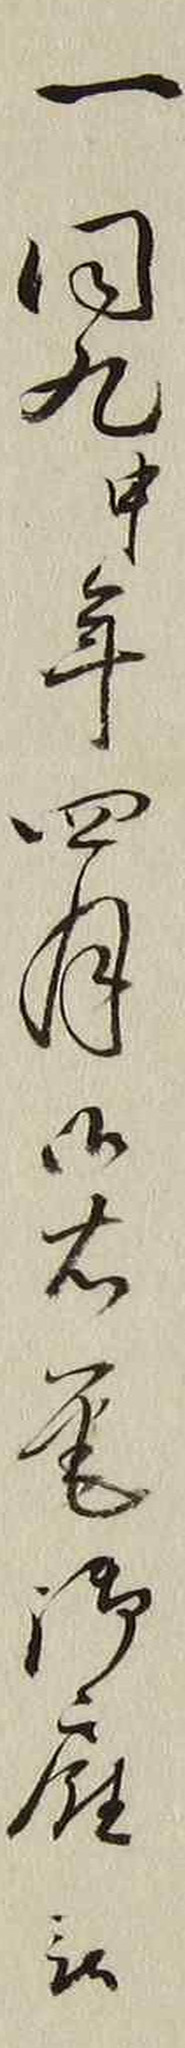一同九申年四月御右筆御雇被
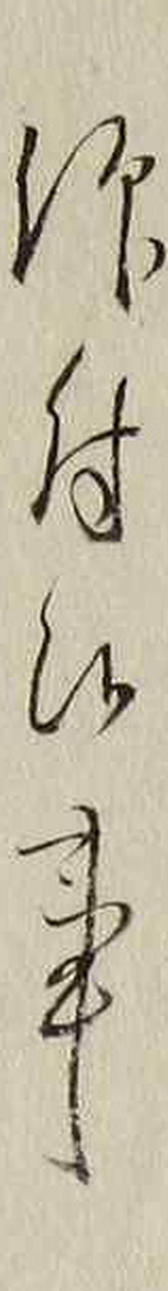仰付候事
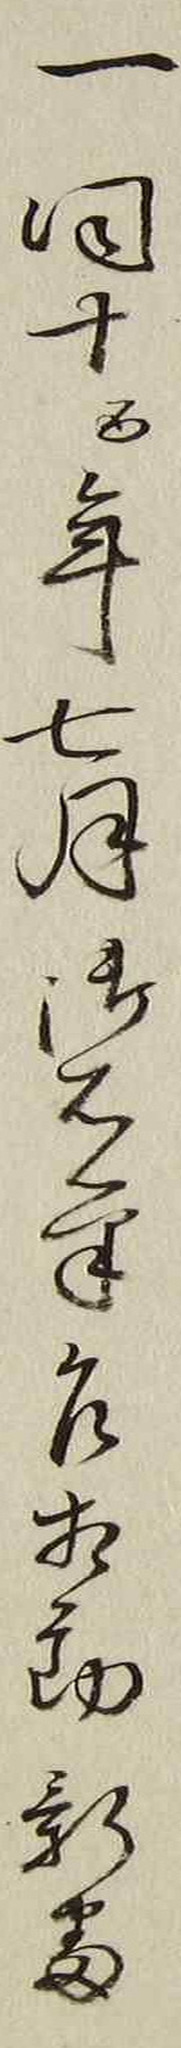一同十酉年七月御右筆乍相勤新番
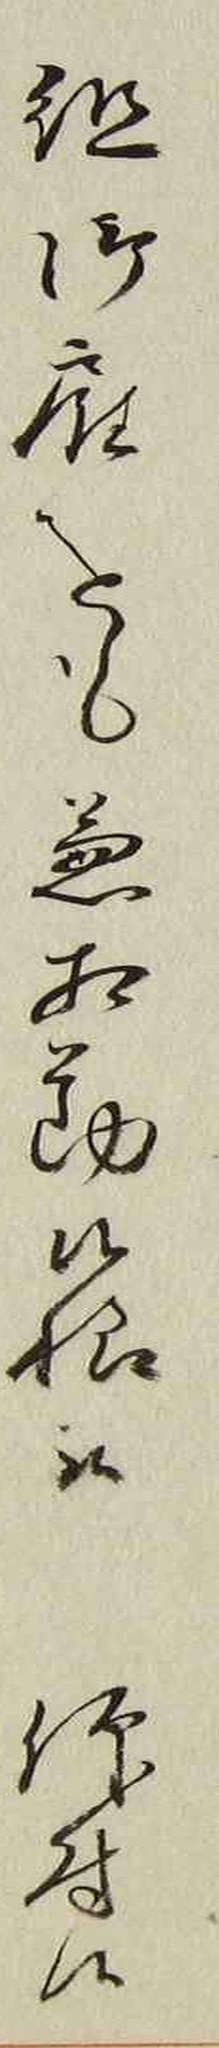組御雇をも兼相勤候様被仰付候
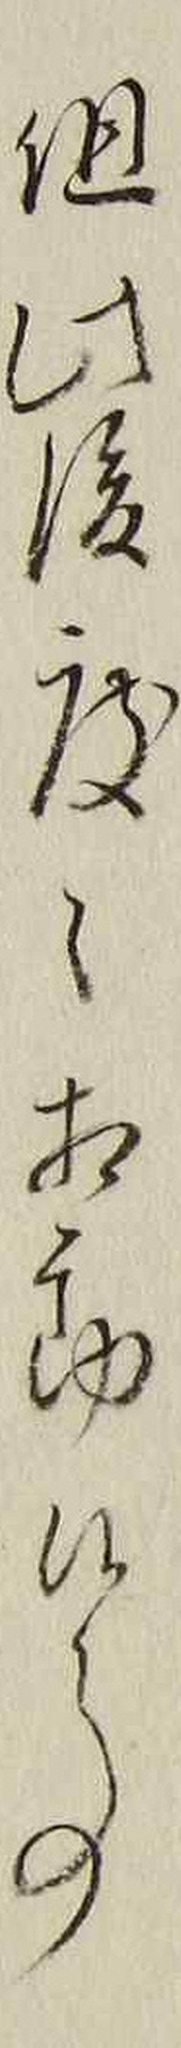但此後度々相勤候事

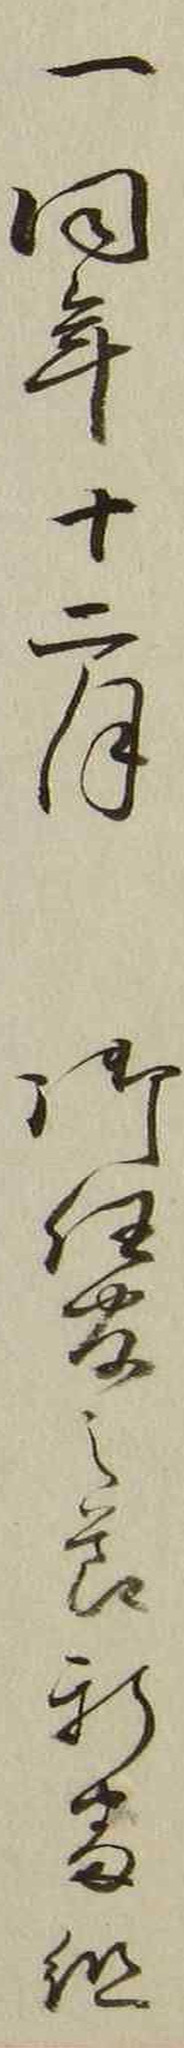一同年十二月御任官之節新番組
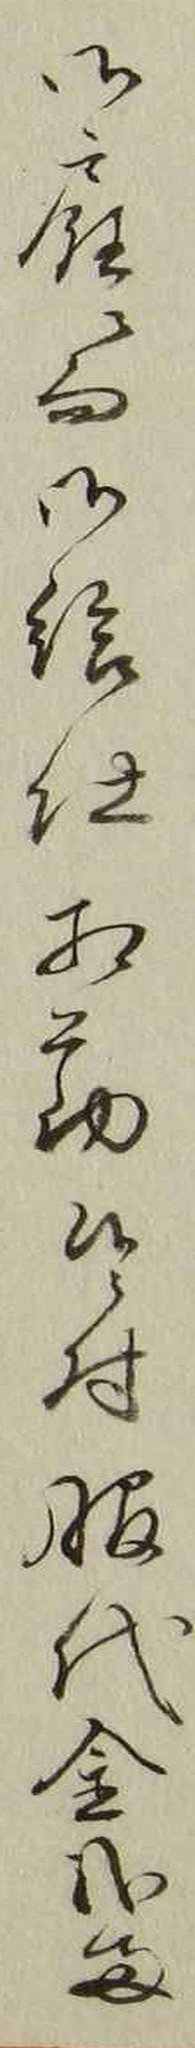御雇ニ而御給仕相勤候ニ付服代金弐両
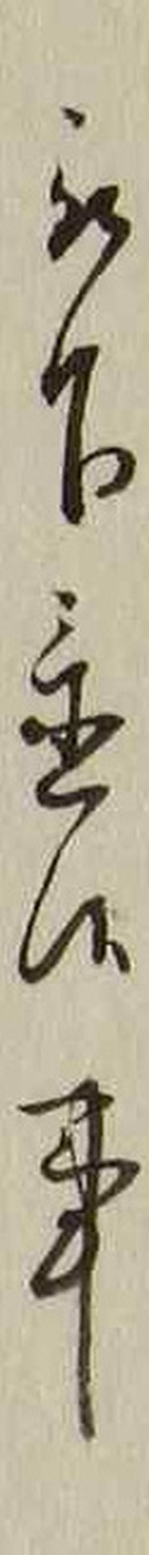被下置候事
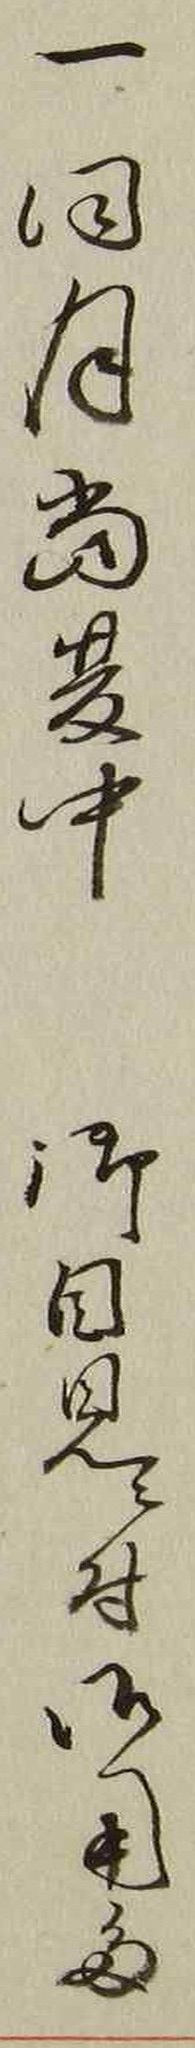一同月当夏中御目見ニ付御用多
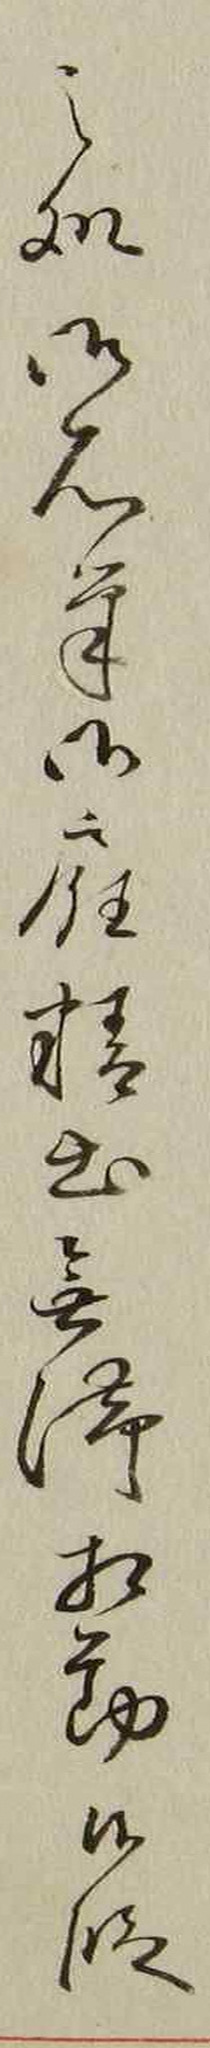之処御右筆御雇精出無滞相勤候段
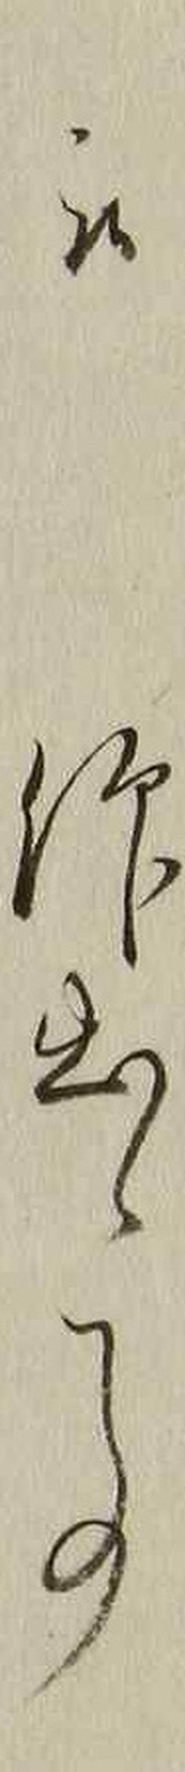被仰出候事
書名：諸士系譜　巻之4　い之部4
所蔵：会津若松市立会津図書館
